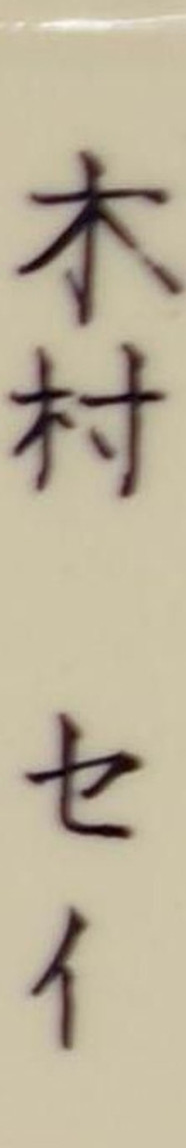木村セイ
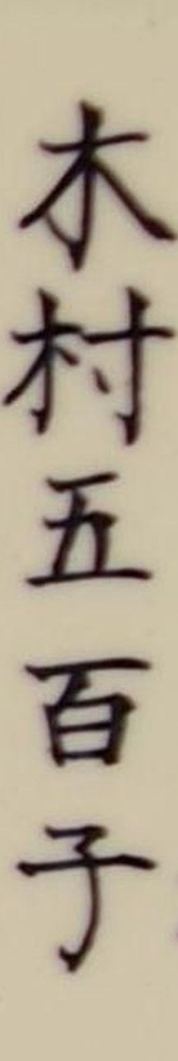木村五百子
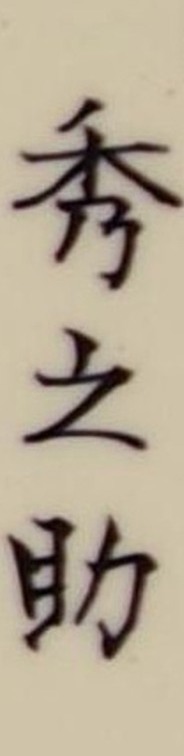秀之助
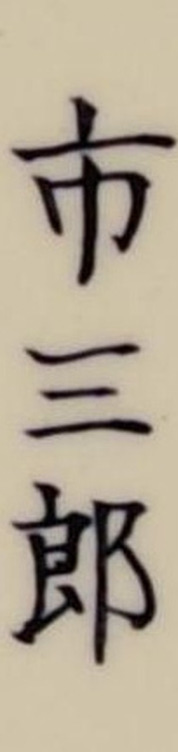市三郎
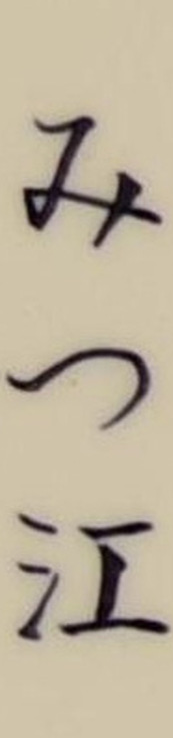みつ江
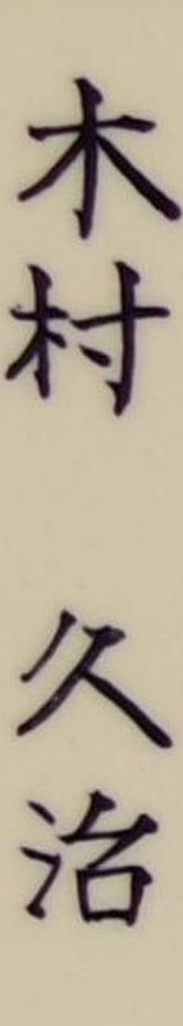木村久治
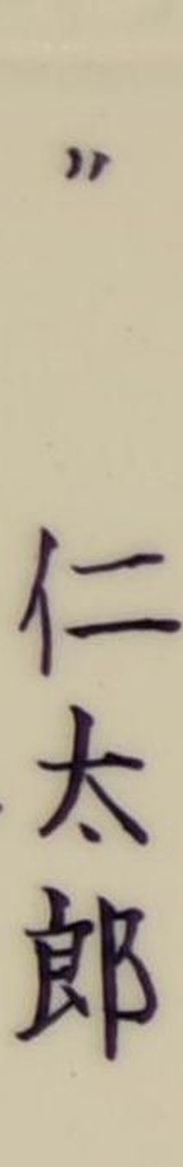仁太郎
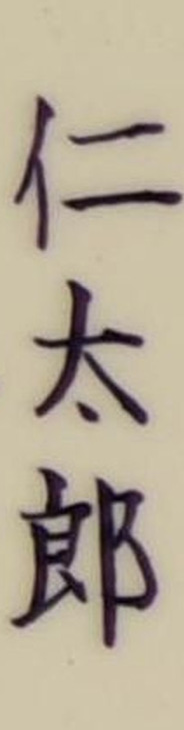仁太郎

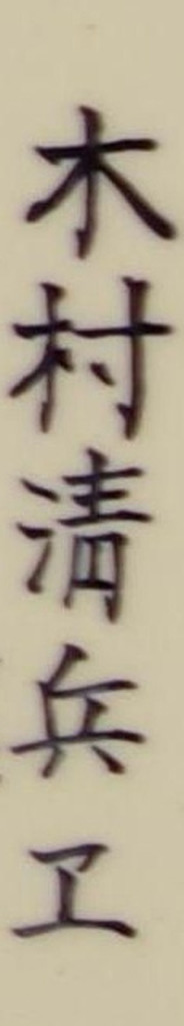木村清兵ヱ
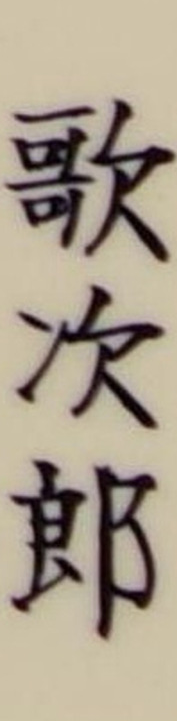歌次郎
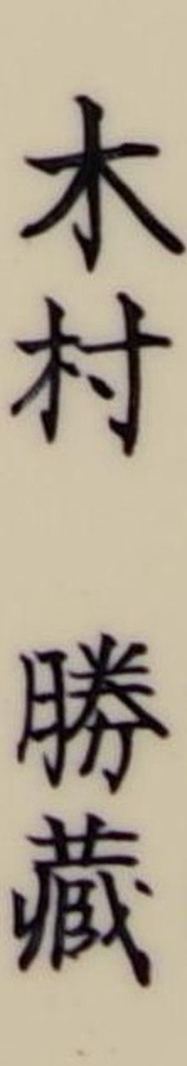木村勝蔵
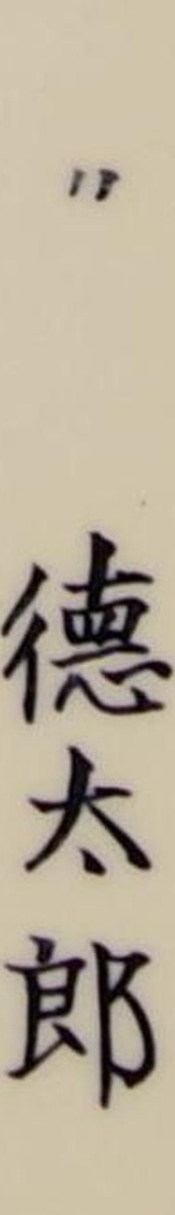徳太郎
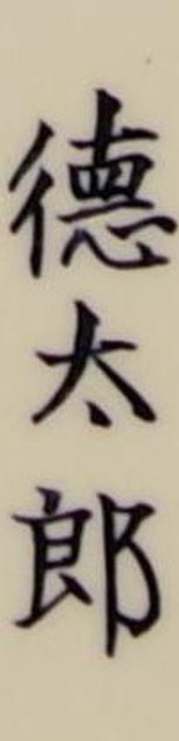徳太郎
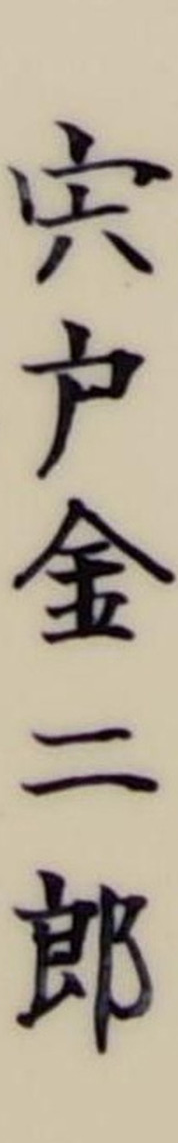宍戸金二郎
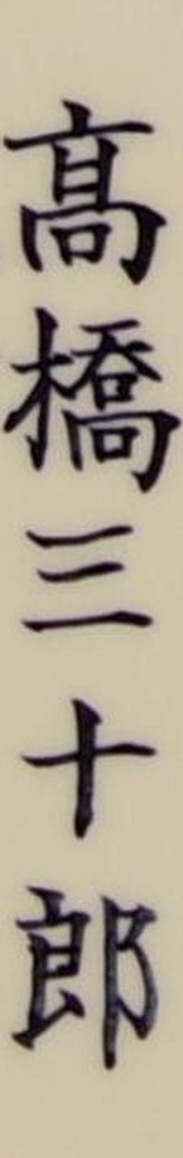高橋三十郎
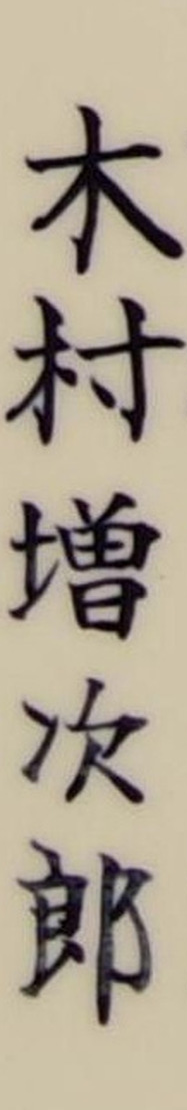木村増次郎
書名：E~L
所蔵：高野山金剛峯寺
